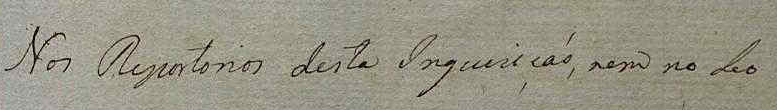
Nos Repertorios desta Inquiziçaõ, nem no seo
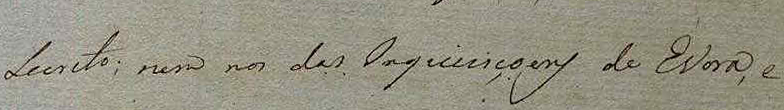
secreto, nem nos das Inquiziçoens de Evora, e
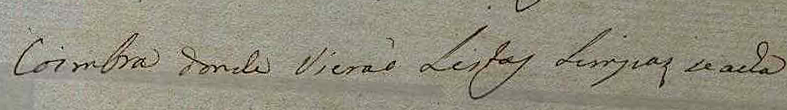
Coimbra donde Vieraõ Listas Limpaz se acha
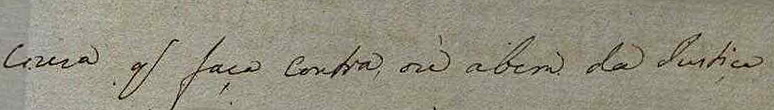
couza q̄ faça contra, ou a bem da Iustiça
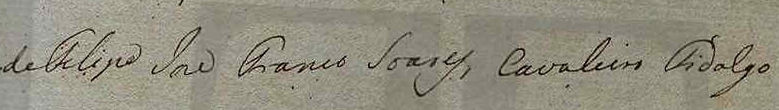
de Felipe Ioze Franco Soares, Cavaleiro Fidalgo
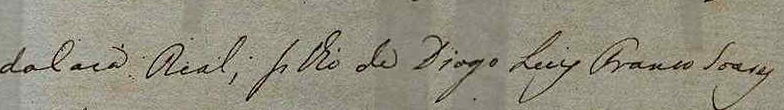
da Caza Real, filho de Diogo Luis Franco Soares
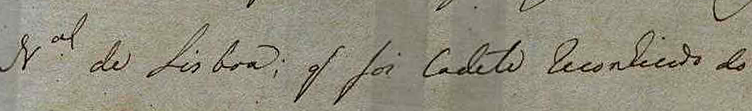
N.al de Lisboa; q̄ foi cadete Reconhecido do
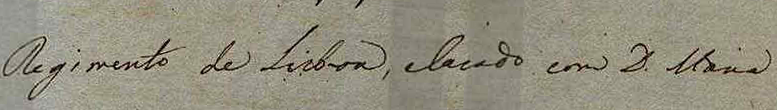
Regimento de Lisboa, e Cazado com D. Maria
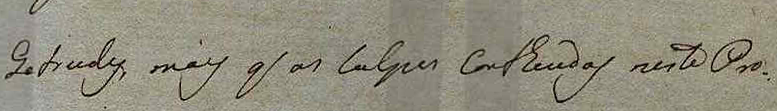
Getrudes, mais q̄ as Culpas Contheudas neste Pro
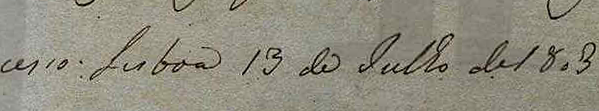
cesso: Lisboa 13 de Iulho de 1803
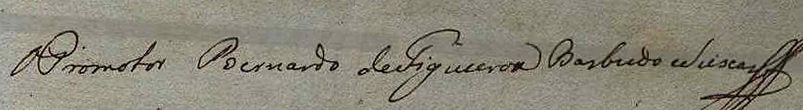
O Promotor Bernardo de Figueiroa Barbudo e Seixas
